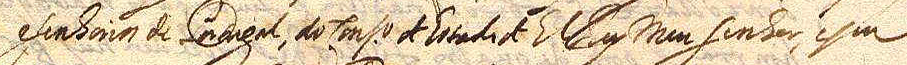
e senhorios de Portugal, do Cons.o d̄ Estado d̄ El Rey meu senhor, e seu
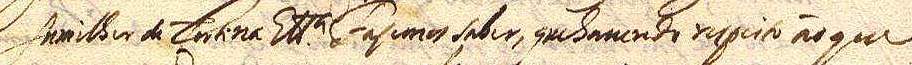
sumilher da Cortina Ett.a Fasemos saber, que hauendo respeito ào que
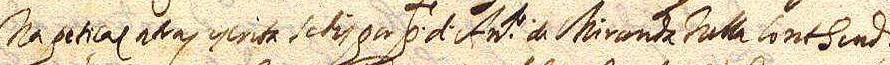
na petiçaõ atras escrita se dis por p.te d. An.to de Miranda nella contheudo
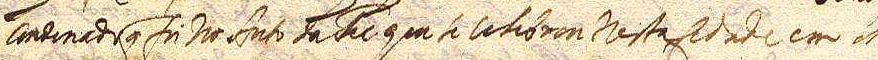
condenado q̄ foi no Auto da Fee que se celebrou nesta Cidade em os
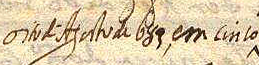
oito de Agosto de 683, em cinco
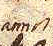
annos
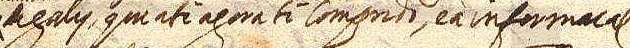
de gales que até agora tē comprido, e a informacaõ
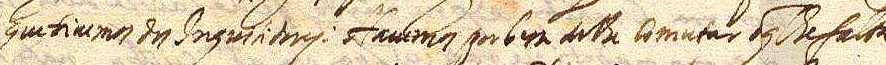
que tiuemos dos Inquisidores: Hauemos por bem de lhe comutar o q̄ lhe falta
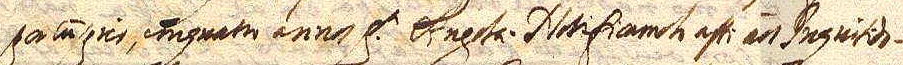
por cūprir, em quatro annos p.a Angola. Notificamos assi aos Inquisido
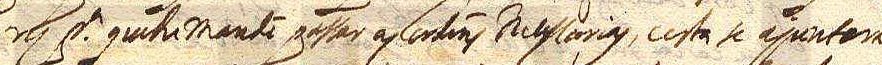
res p.a que lhe mandē passar as ordens̄ necessarias, e esta se ajuntará
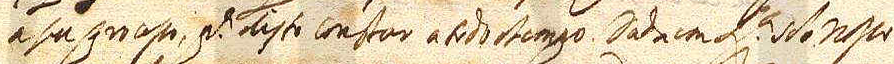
a seu processo, p.a disto constar a todo o tempo. Dada em Lx.a sob nosso
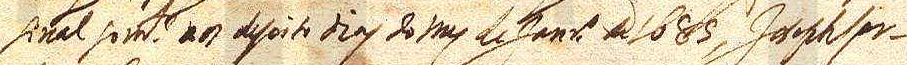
sinal som.te aos desoito dias do mes de Janr.o de 1685, Joseph Car
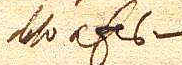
doso a fes ‒
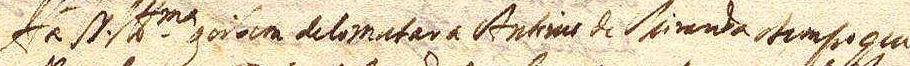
Há Vs. Ill.ma por bem de comutar a Antonio de Miranda o tempo que
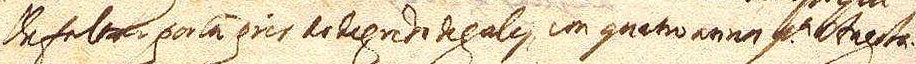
lhe falta por cūprir do degredo de gales, con quatro annos p.a Angola.
